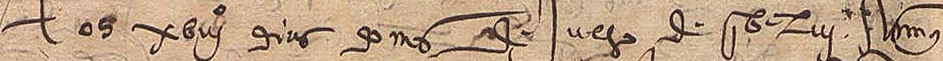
Aos xbiijo dias do mes de Julho de j̄bcLiij Annꝯ
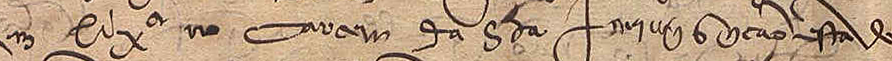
em lixa no Carcere da Sta Jmquysycão estādo
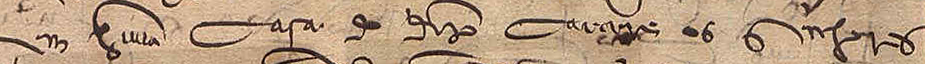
em h̄uua Casa do dit̄o Carçere os senhores
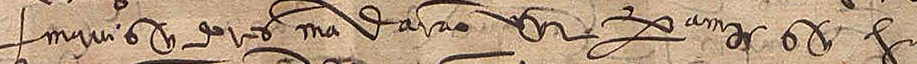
Jmquisydores mādarão vyr ꝑamte sy ha
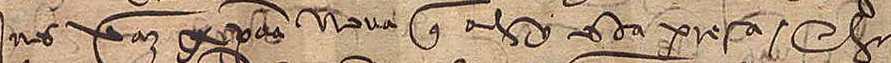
Jnes Vāz xp̄aa Noua q̄ ahy esta presa / e ha
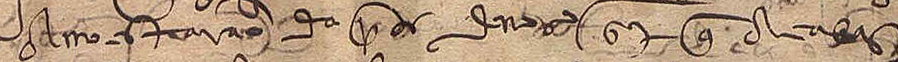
Amoestarão da p̄te de noso s̄r q̄ Acabase
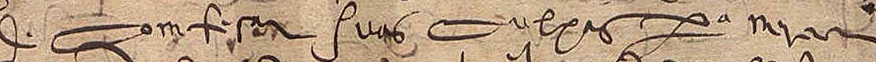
de Comfesar suas Culpas ꝑa mercer
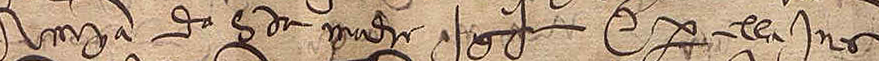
A mȳa da Sta madre JgJa e ꝑ ella Jnes
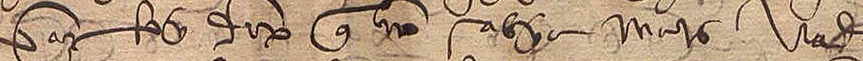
Vāz foy dit̄o q̄ nō sabya majs Nada
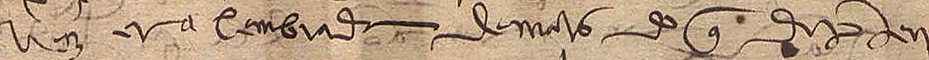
nem era lembrada de majs do q̄ dito ten
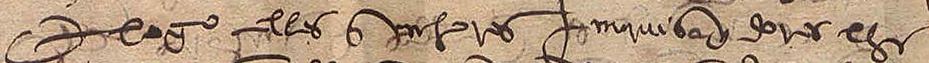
E logo elles senhores Jmquisydores lhe
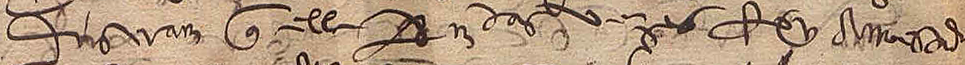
diseram q̄ ella ꝑ mtas vezes foy Amoestad
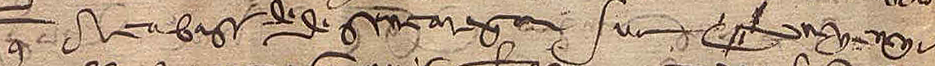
q̄ Acabase de desencaregar sua Concyencya
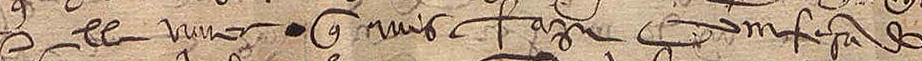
e ella nunca o q̄ mis fazer Comfesādo
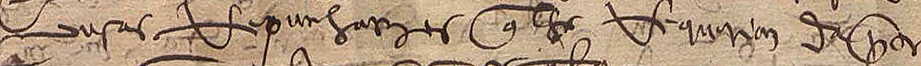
Cousas Repunhantes q̄ lhe Requeriam da p̄te
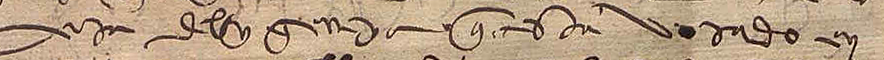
Certa delygencya q̄ esta Votado em
